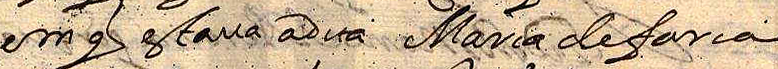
em q̄ estaua a dita Maria de faria
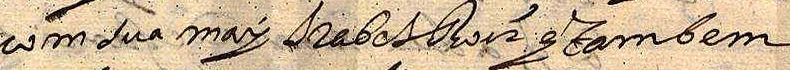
com sua may Izabel Roiz̄ q̄ tambem
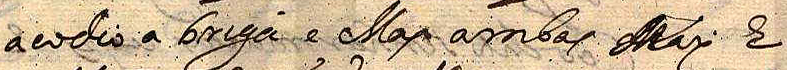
acodio a briga e ellas ambas May E
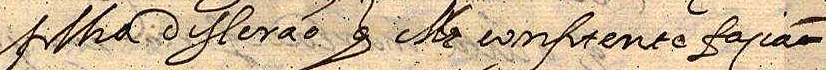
filha disseraõ q̄ elle confitente faziaõ
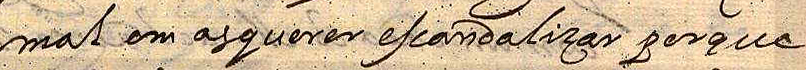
mal em as querer escandalizar porque
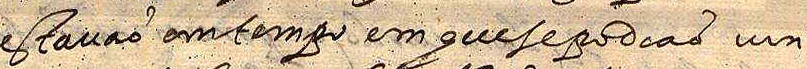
estauaõ em tempo em que se podiaõ uin
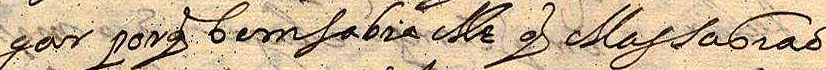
gar porq̄ bem sabia ele q̄ ellas sabiaõ
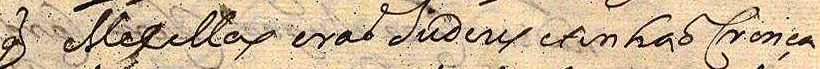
q̄ elle e ellas eraõ Iudeus e tinhaõ Crença
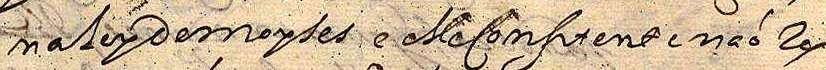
na ley de moyses e elle Confitente naõ Res
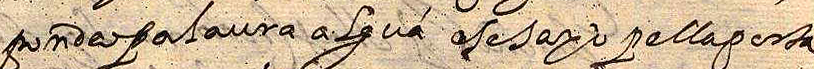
pondeo palaura alguā e se sayo pella porta
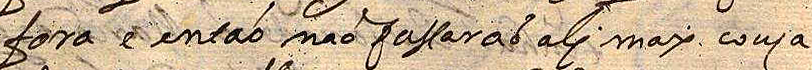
fora e entaõ naõ passaraõ alj mais couza
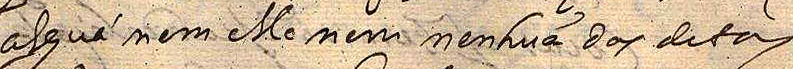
alguā nem elle nem nenhuā das ditas
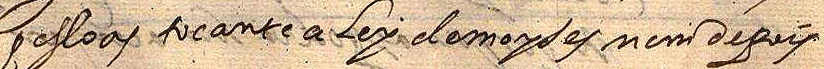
pessoas tocante a Ley de moyses nem depois
